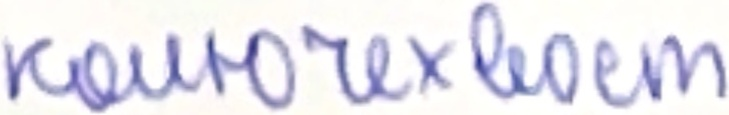колючехвост
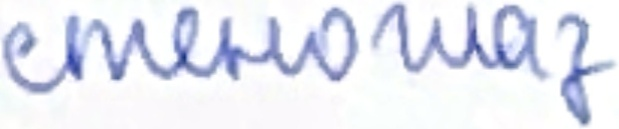стеноглаз
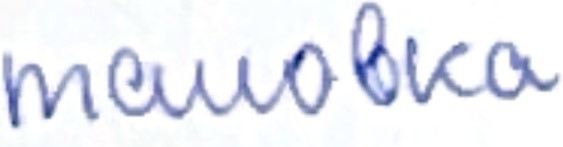таловка
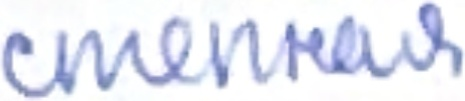степная
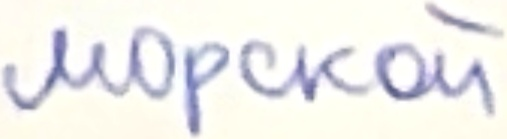морской
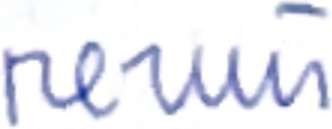пегий
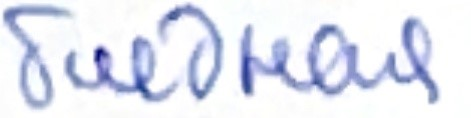бледная
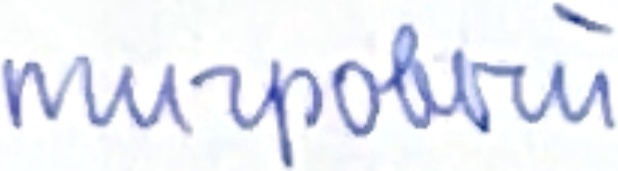тигровый
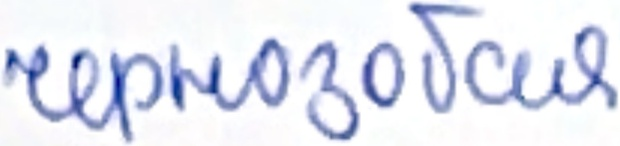чернозобая
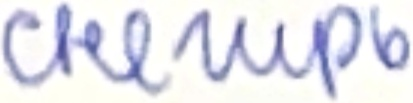снегирь
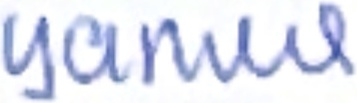цапля
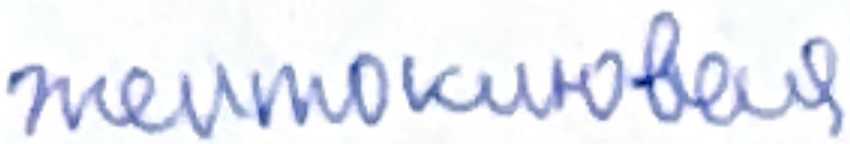желтоклювая
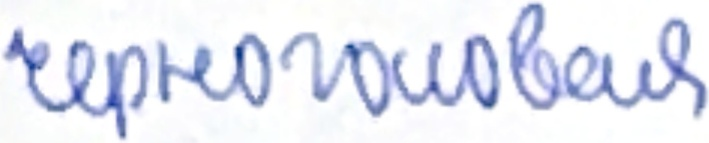черноголовая
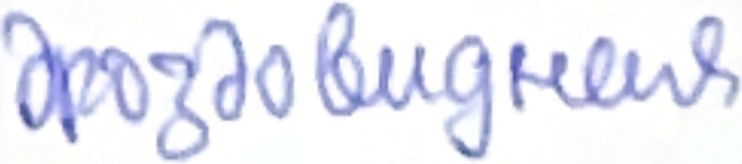дроздовидная
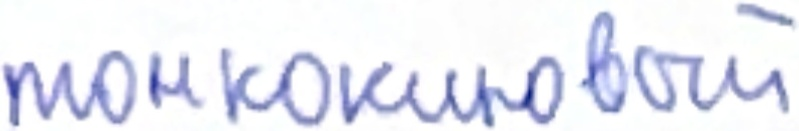тонкоклювый
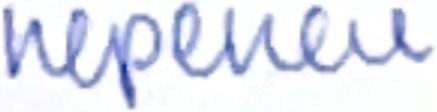перепел
